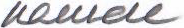канюк
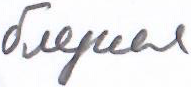бледная
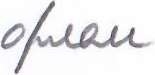орлан
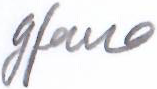дронго
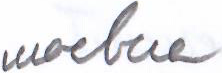моевка
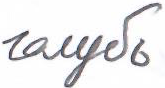голубь
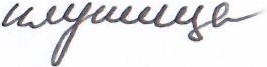клушица
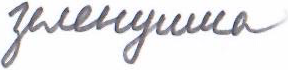зеленушка
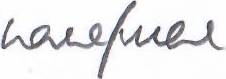полярная
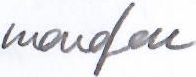топорок
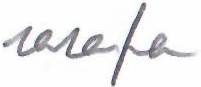гагара
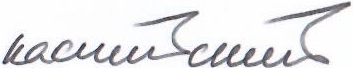каспийский
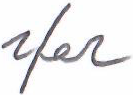грач
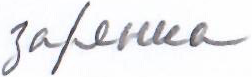зарянка
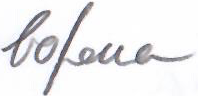ворона
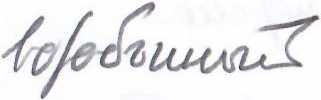воробьиный
